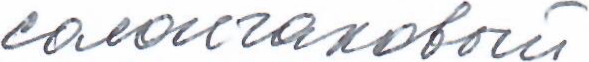солончаковый
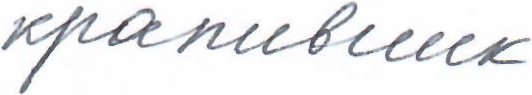крапивник
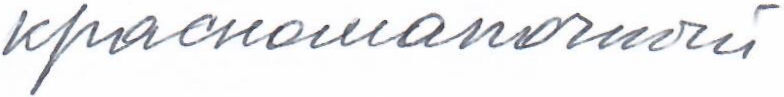красношапочный
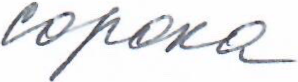сорока
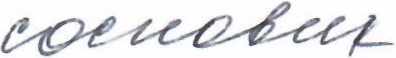сосновик
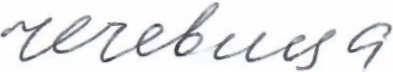чечевица
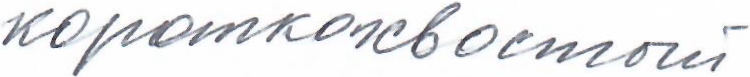короткохвостый
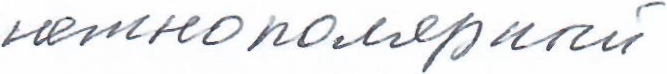южнополярный
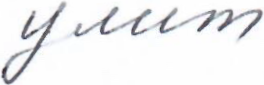улит
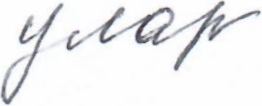улар
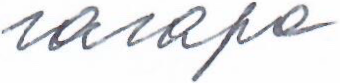гагара
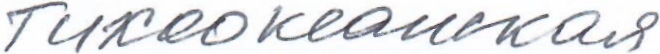тихоокеанская
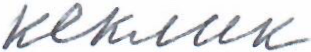кеклик
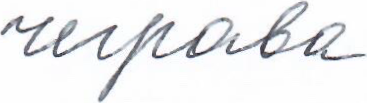чеграва
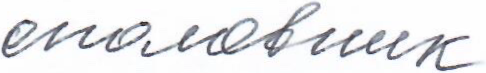ополовник
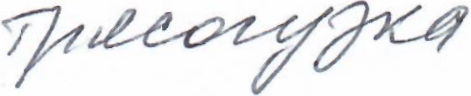трясогузка
